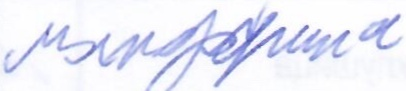мандорина
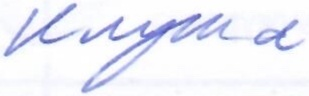клуша
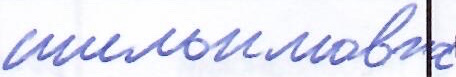шильклювка
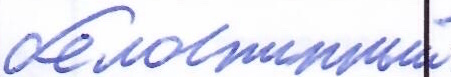белоспинный
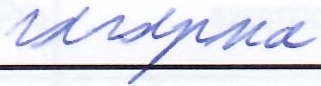гагарка
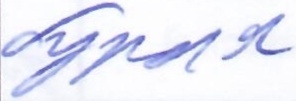бурая
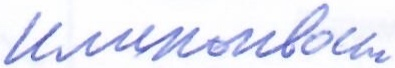клинохвост
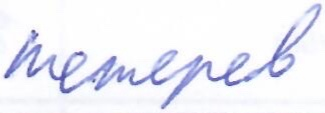тетерев
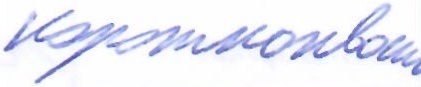короткохвост
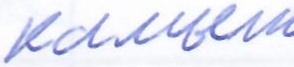камыш
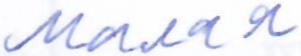малая
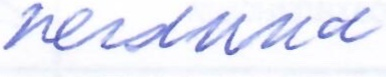пеганка
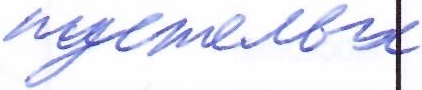пустельга
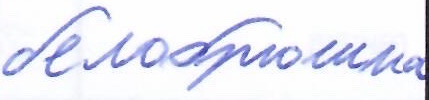белобрюшка
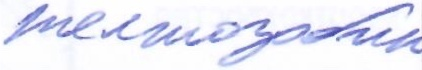желтозобик
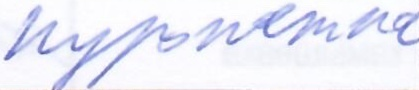куропатка
